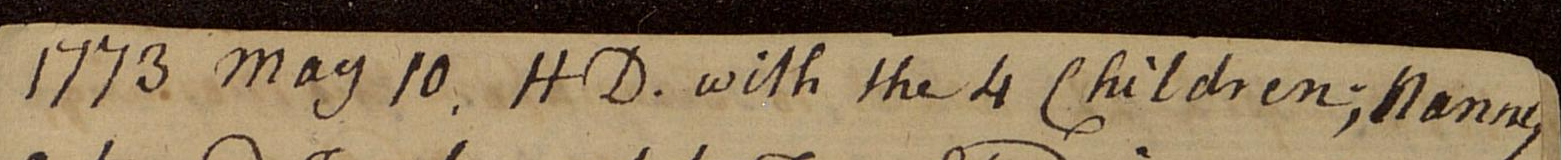1773 May 10. HD. with the 4 Children; Nanny
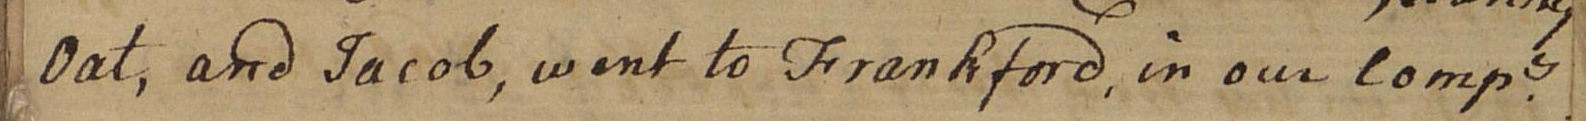Oat, and Jacob, went to Frankford in our Comp^y.
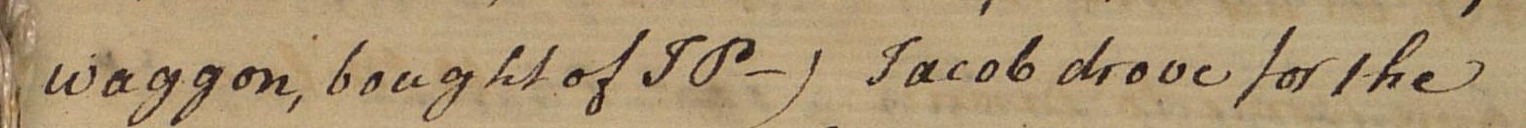waggon, bought of SP-) Jacob drove for the
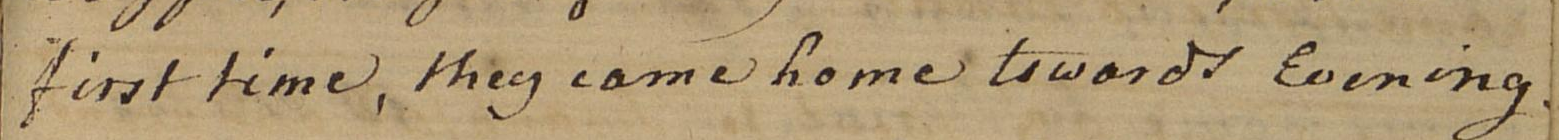first time they came home towards Evening
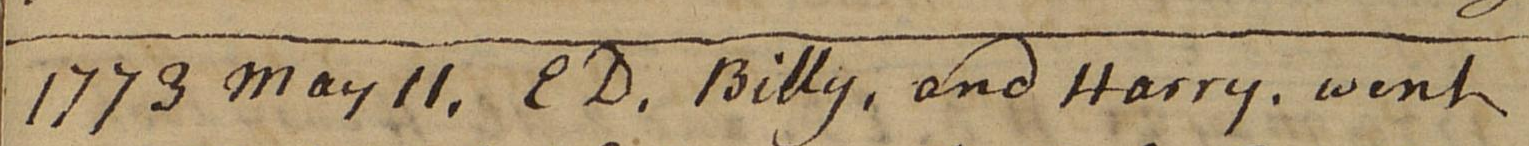1778 May 11, ED. Billy, and Harry. went
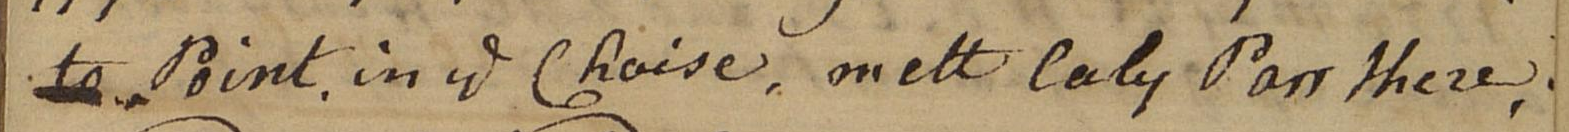to Point in y^e Chaise, mett Caly Parr there,
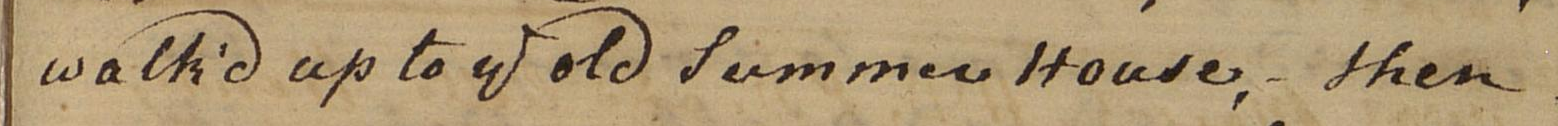walk'd up to y^e old Summer House,- then
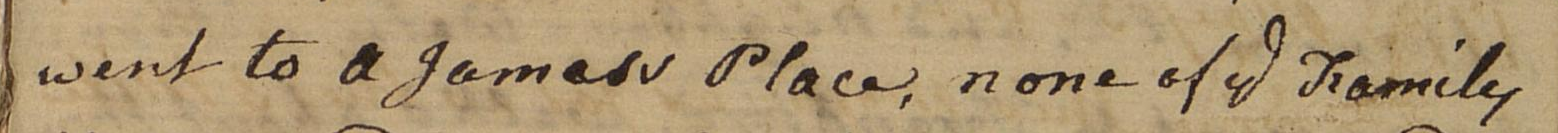went to A James Place, none of y^e Family
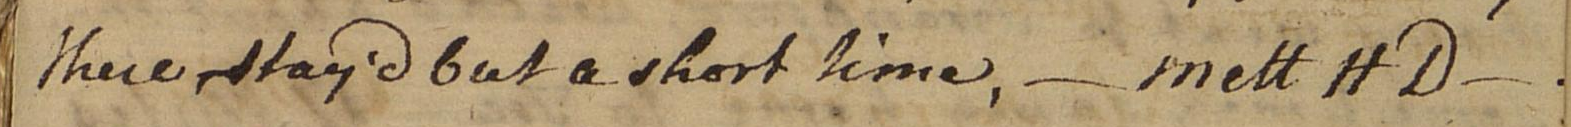there stay'd but a short time,- mett HD-
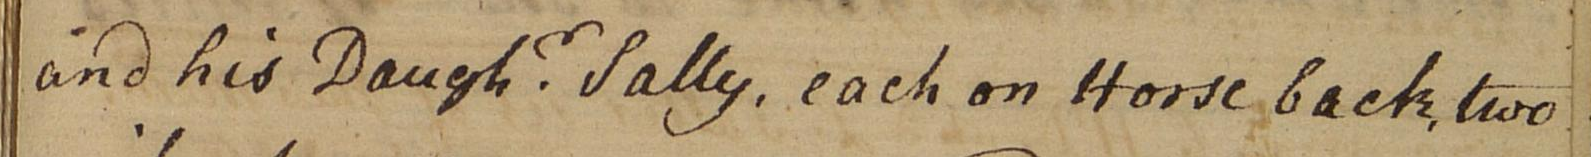and his Daugh^r. Sally, each on Horse back, two
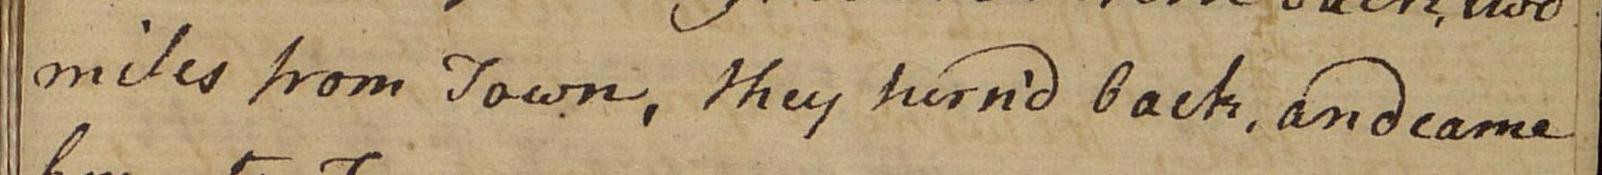miles from Town, they turn'd back, and came
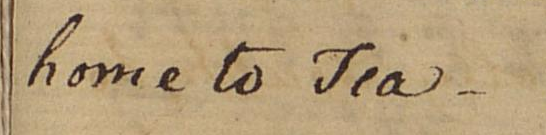home to Tea-
